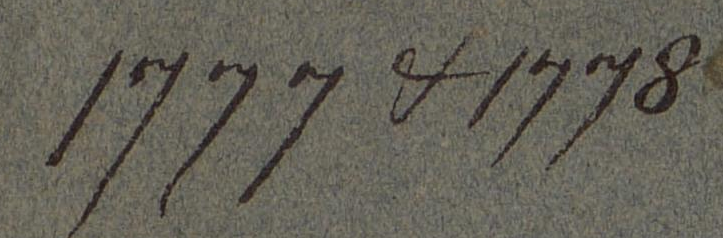1777 & 1778
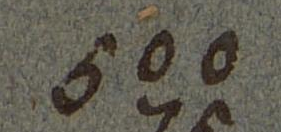500
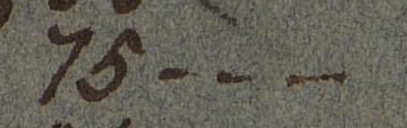75---
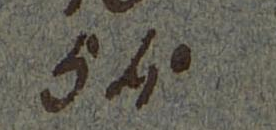54
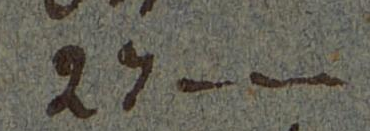27--
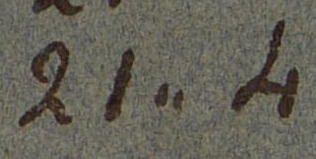21 .. 4
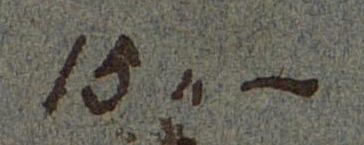15 ..-
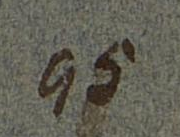95
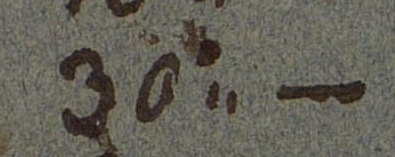30..-
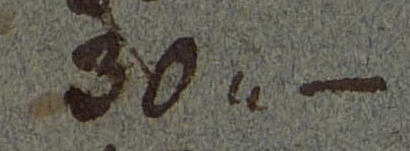30 ..-
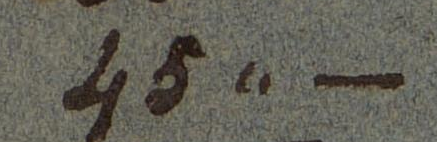45..-
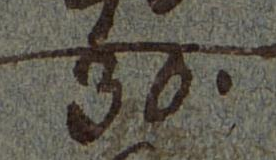30
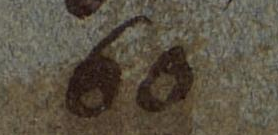60
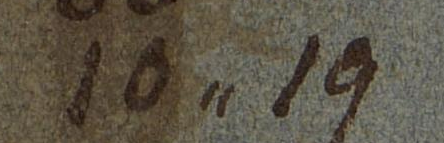10..19
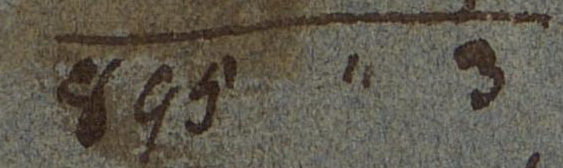895..3
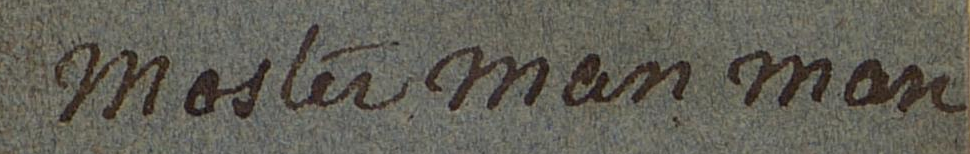Master Man Man
